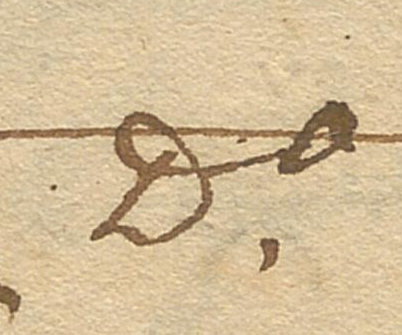D^o.
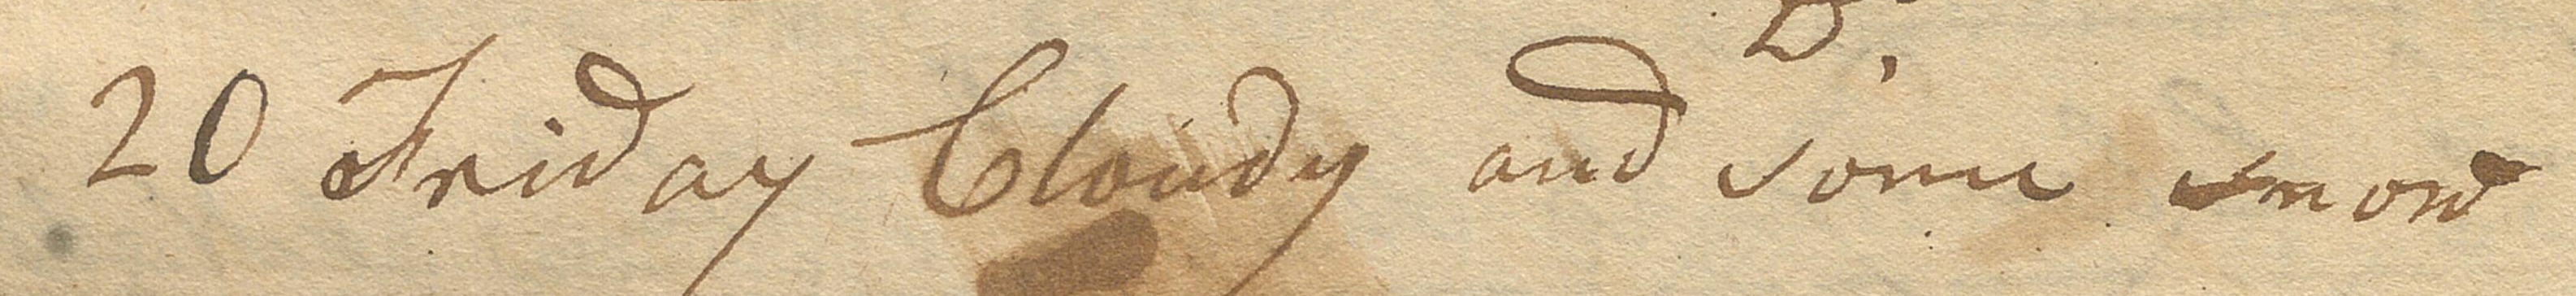20 Friday Cloudy and some snow
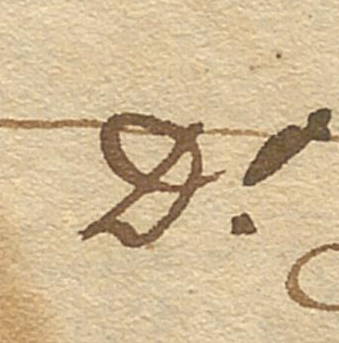D^o.
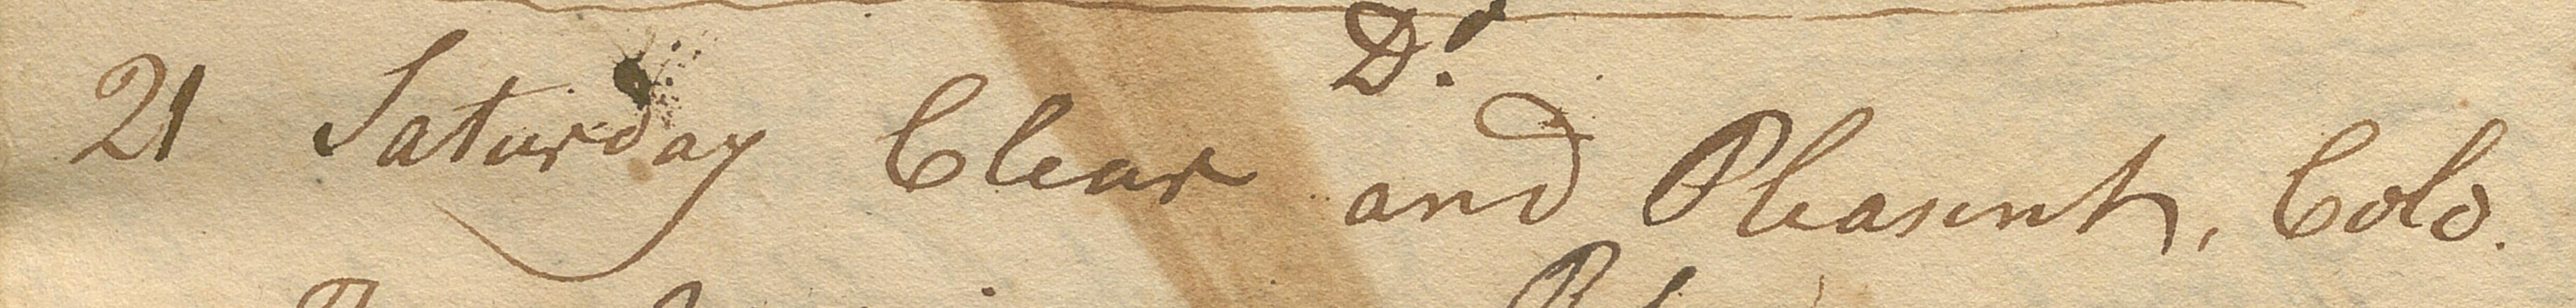21 Saturday Clear and Pleasent, Colo
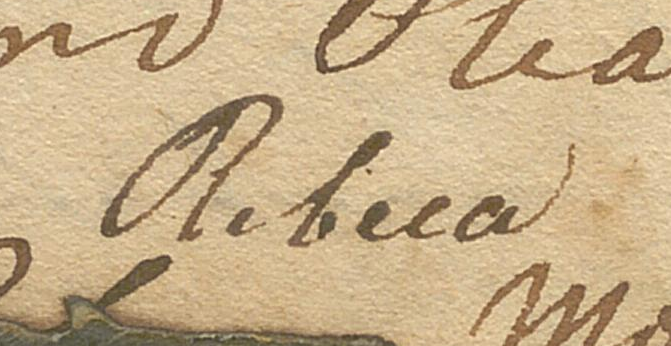Rebeca
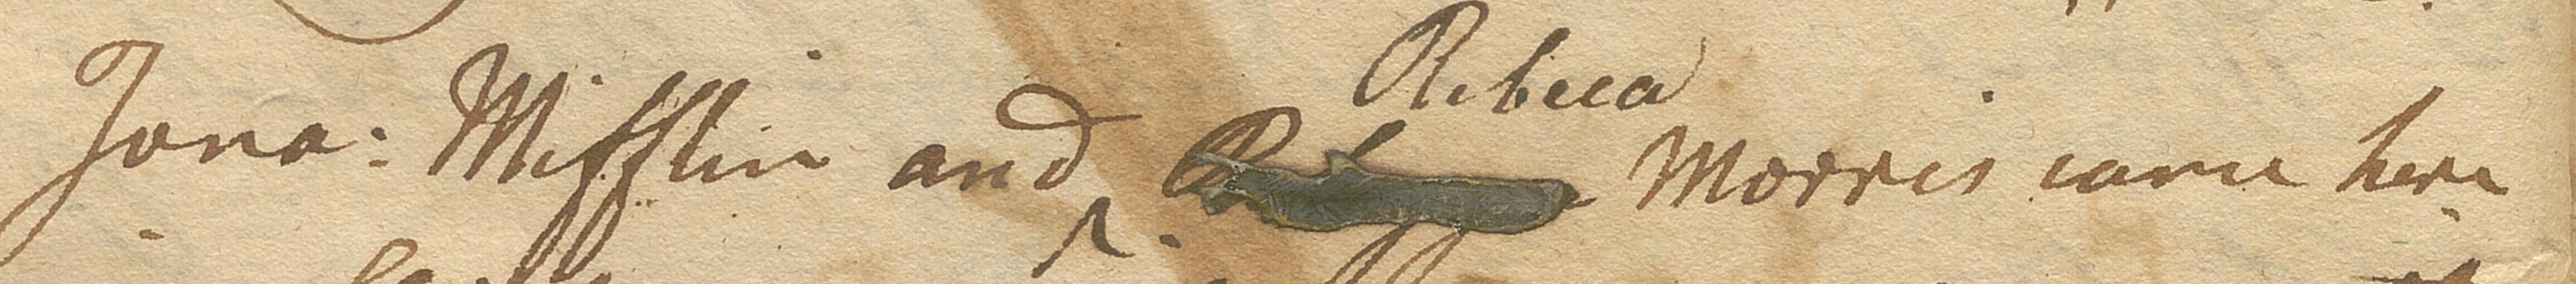Jona: Mifflin and, [______] Morris came here
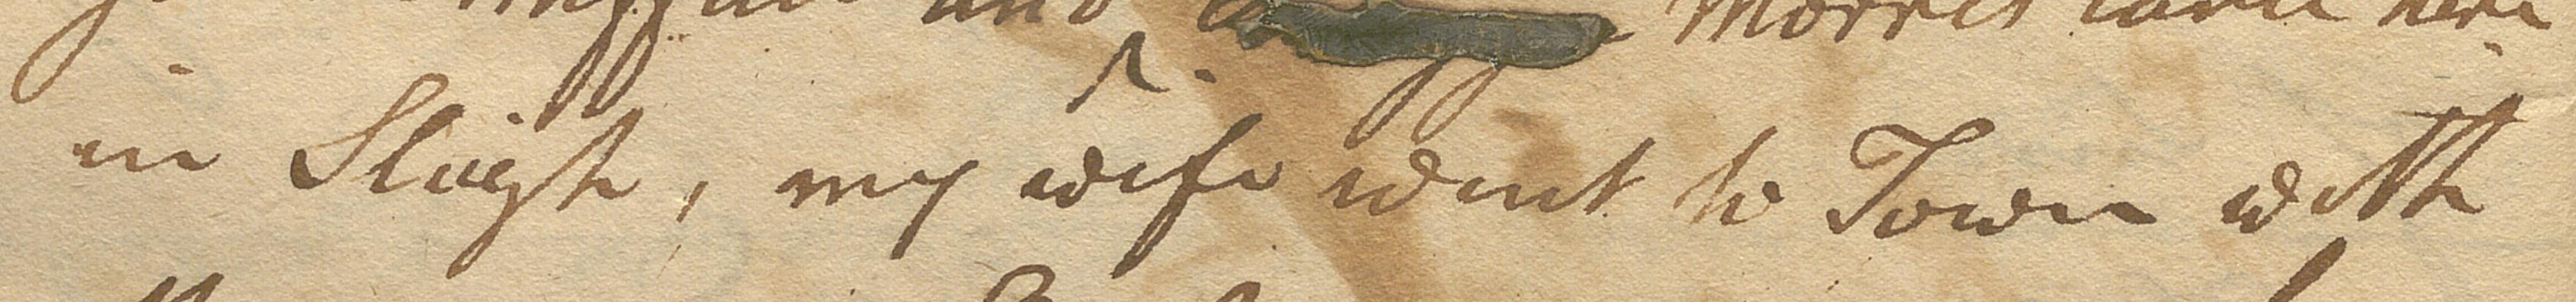in Sleigh, my wife went to Town with
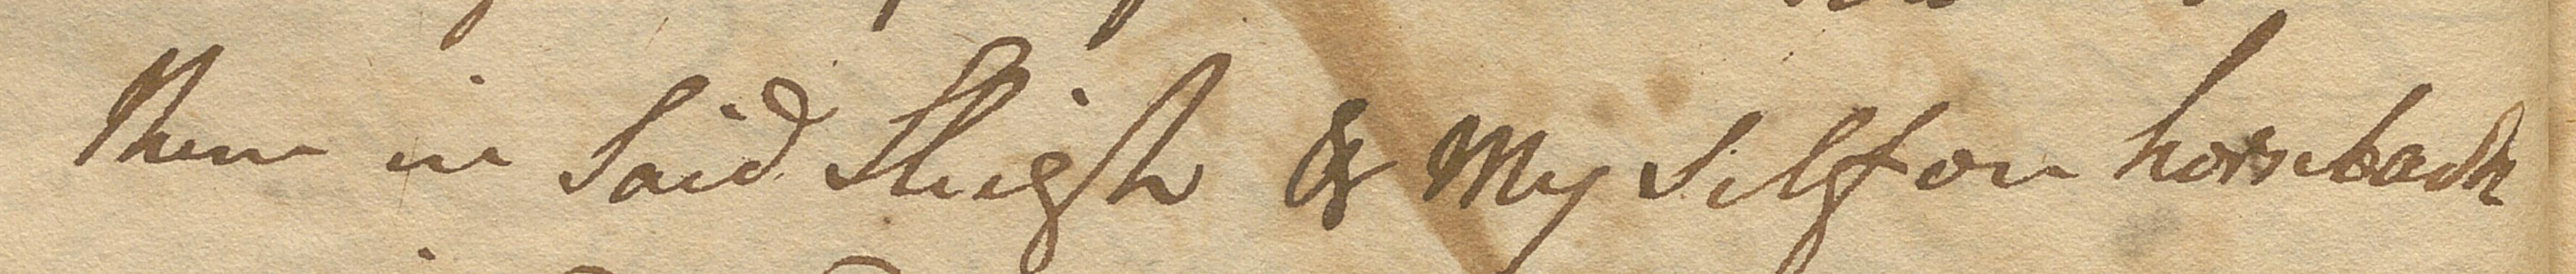them in Said Sleigh & My self on horseback
